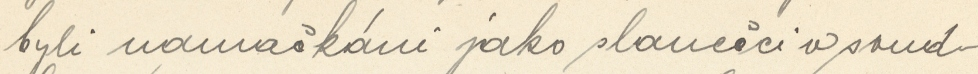byli namačkáni jako slanečci v soud-
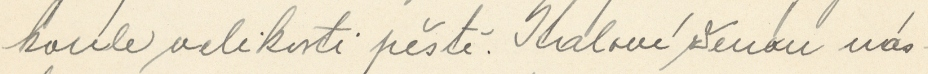koule velikosti pěstě. Italové ženou nás -
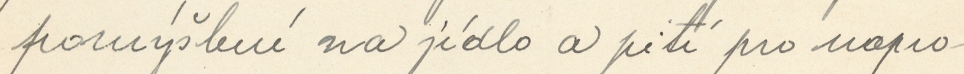pomýšlení na jídlo a pití pro napro-
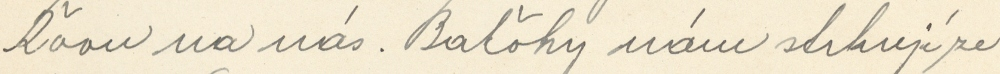Řvou na nás. Baťohy nám strhují ze
